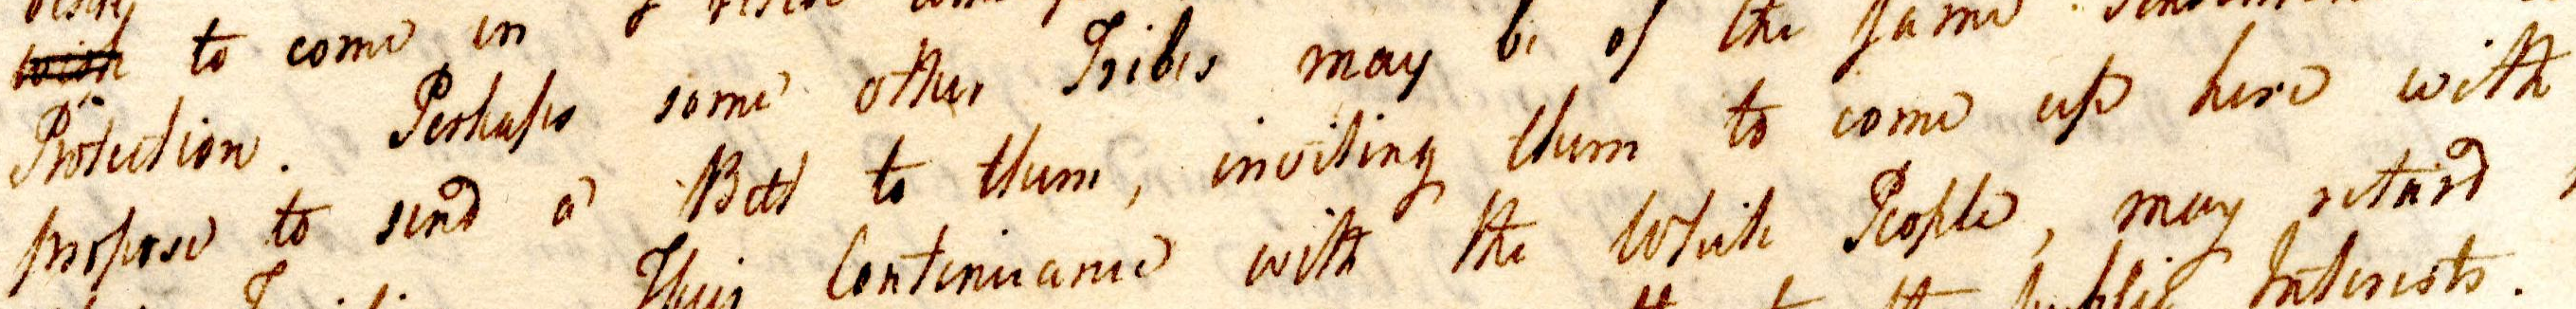propose to send a Btl to them, inviting them to come up here with
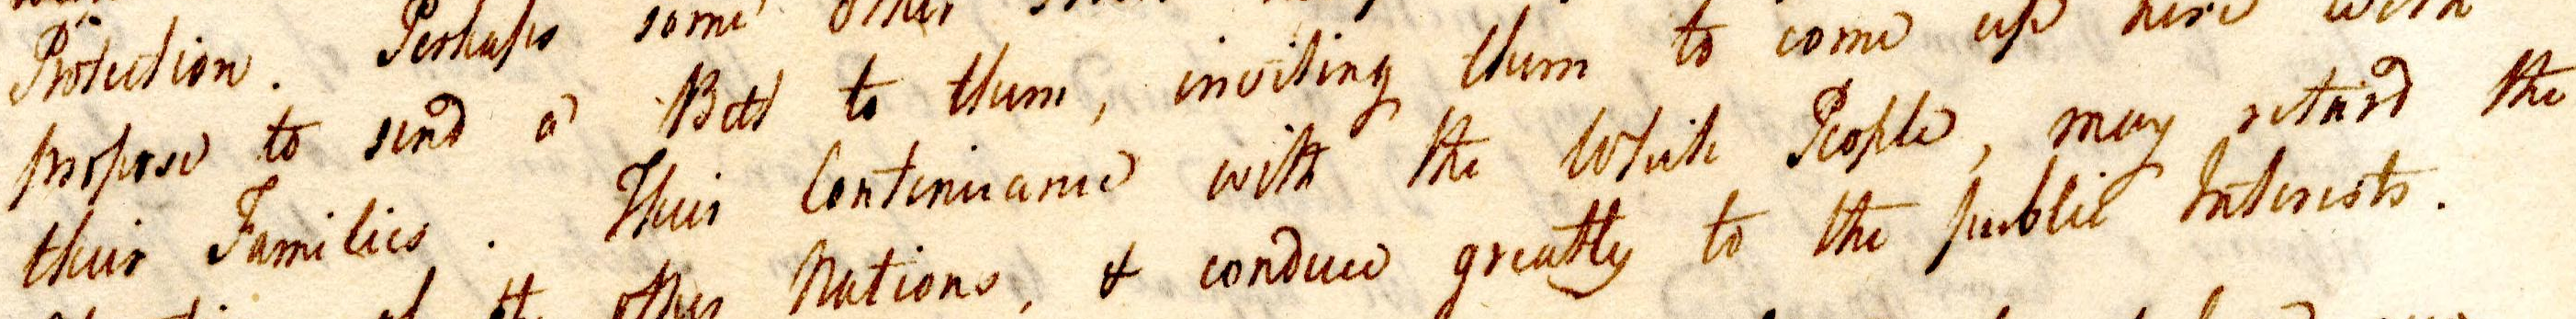their Families. Their Continuance with the White People, may retard the
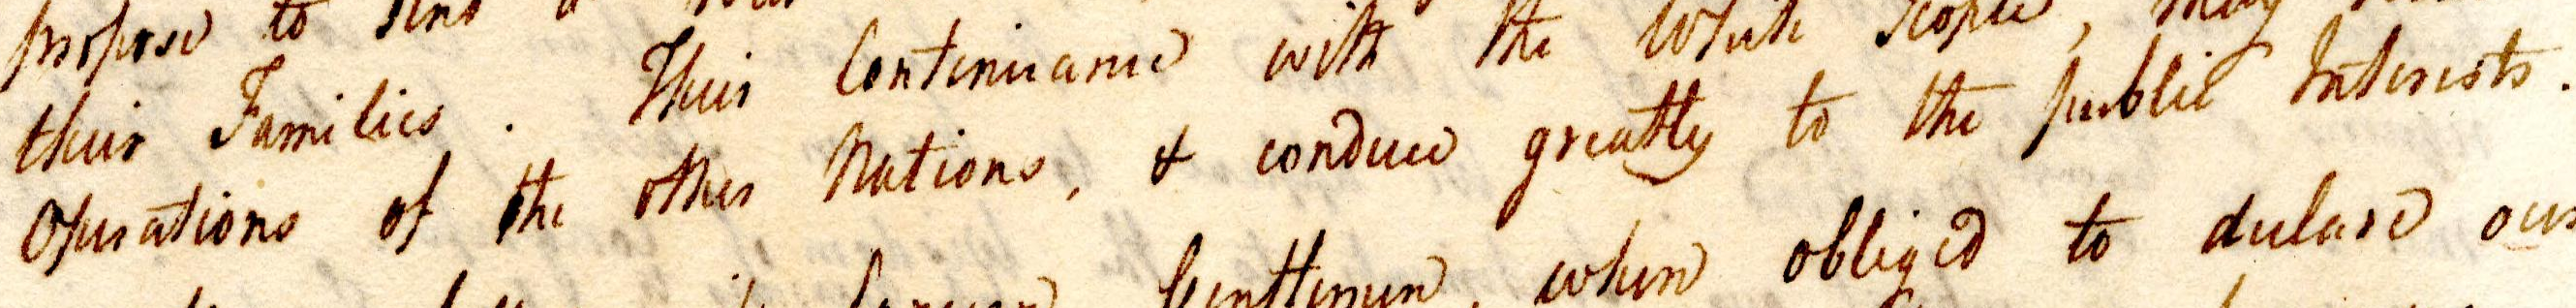Operations of the other Nations, & conduce greatly to the public Interests.
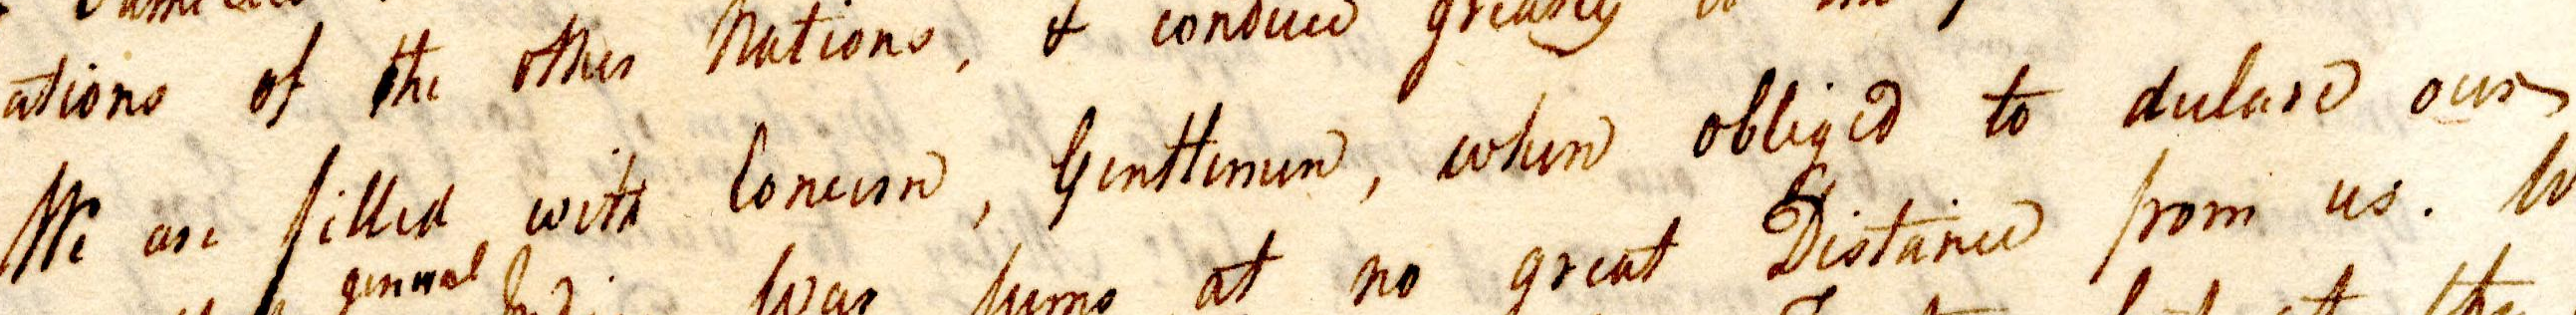We are filled with Concern, Gentlemen, when obliged to declare our
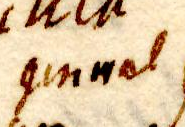general
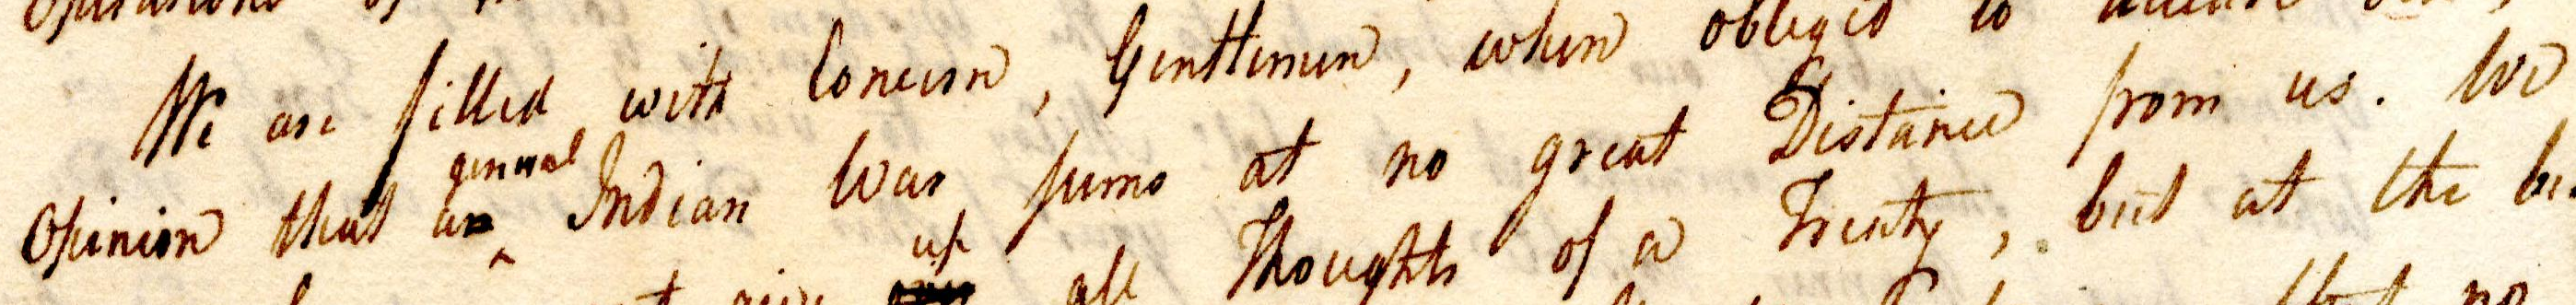Opinion that an ^ Indian War sums at no great Distance from us. We
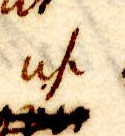up
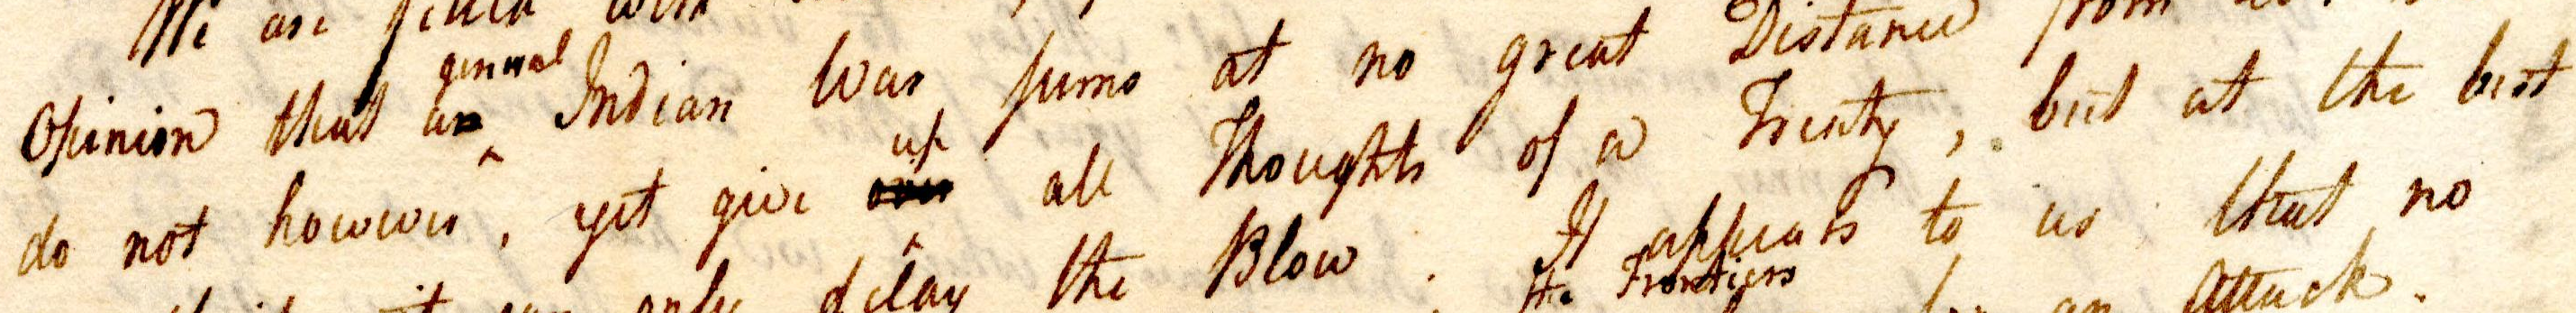do not however, yet give ^ over all Thoughts of a Treaty, but at the best
